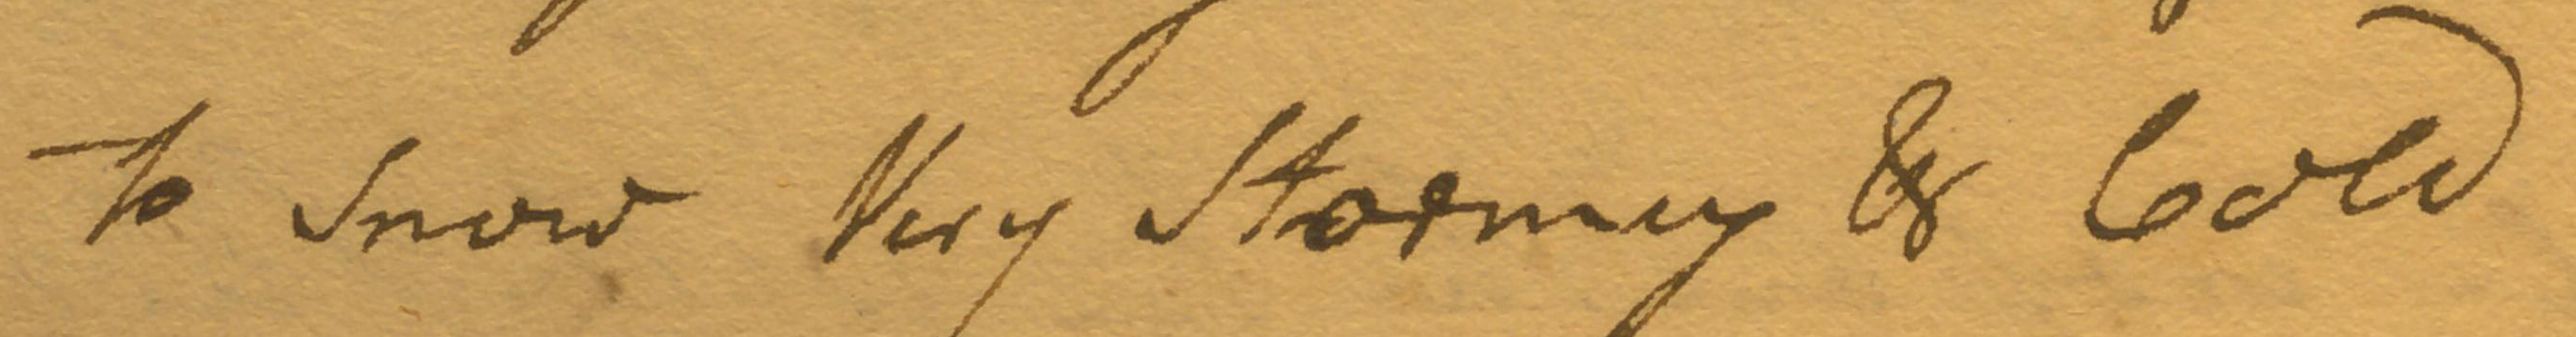to Snow Very Stormey & Cold
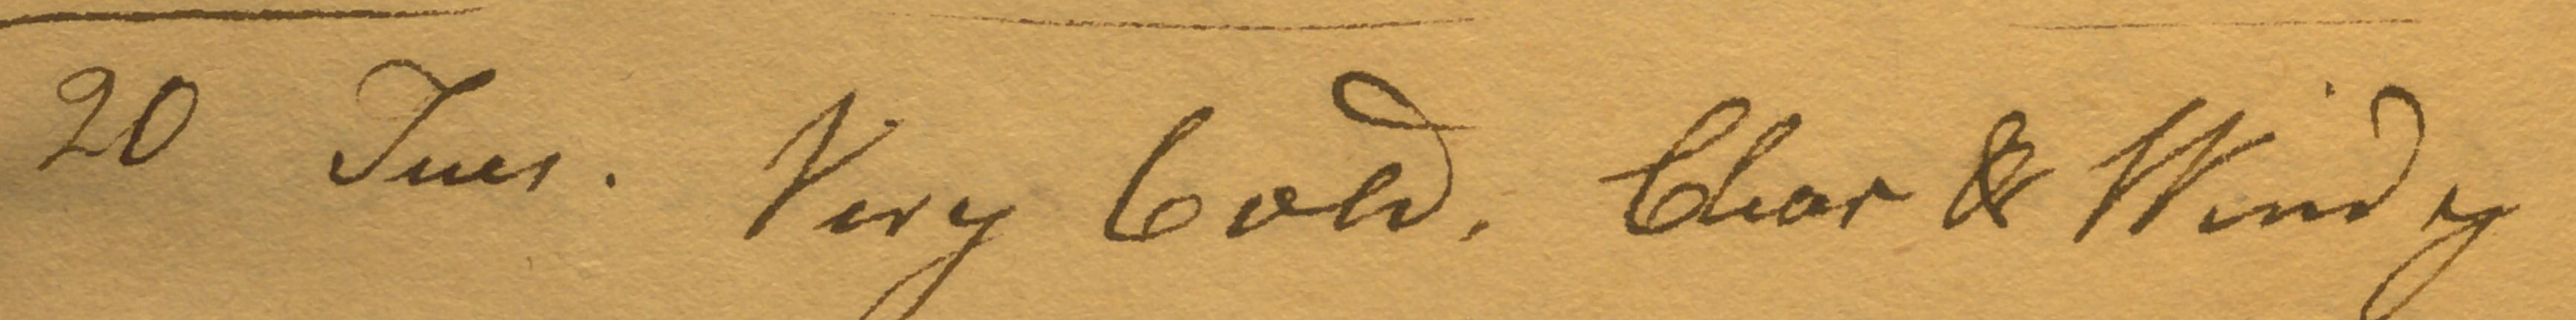20 Tues. Very Cold. Clear & Windy
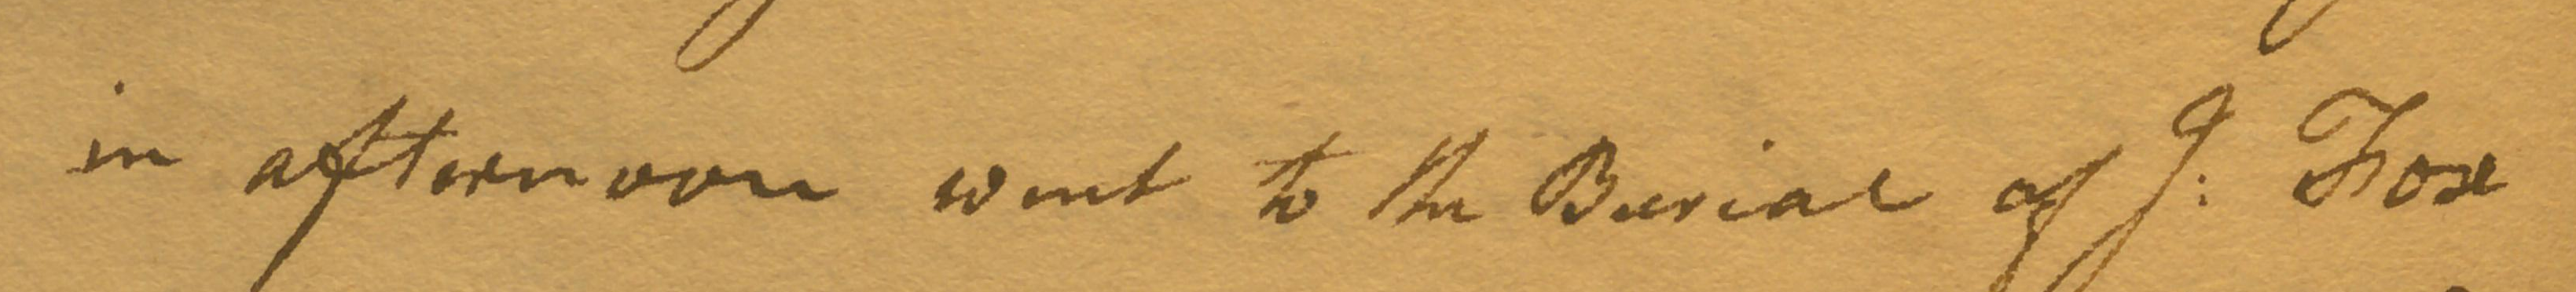in afternoon went to the Burial of J: Fox
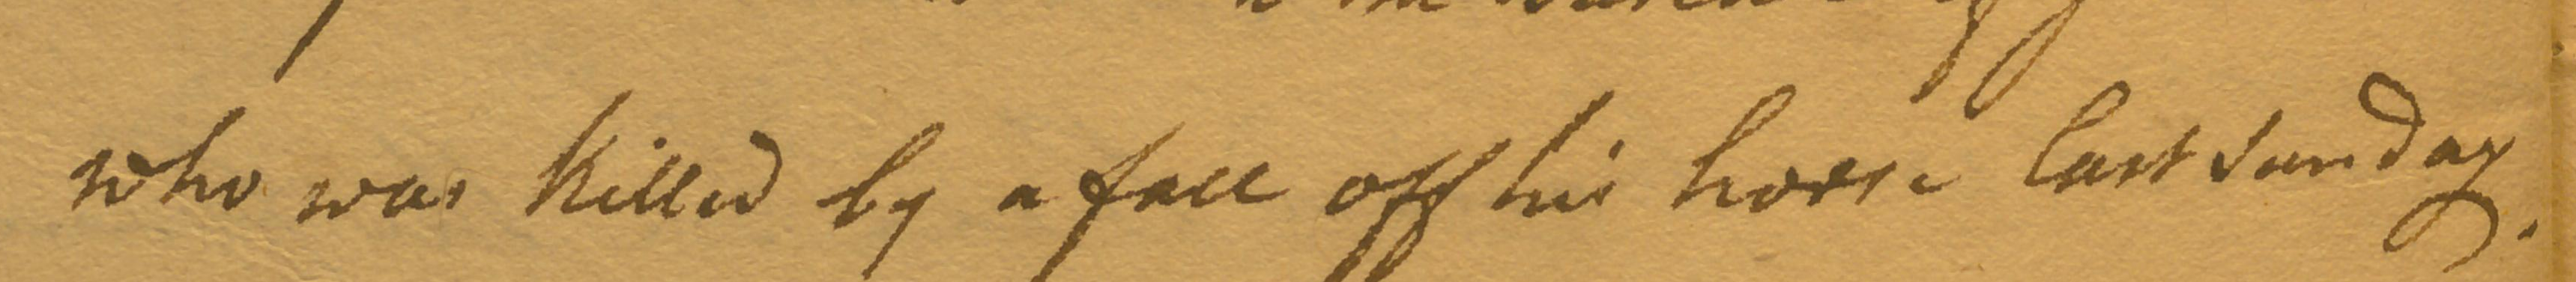who was Killed by a fall off his horse last Sunday
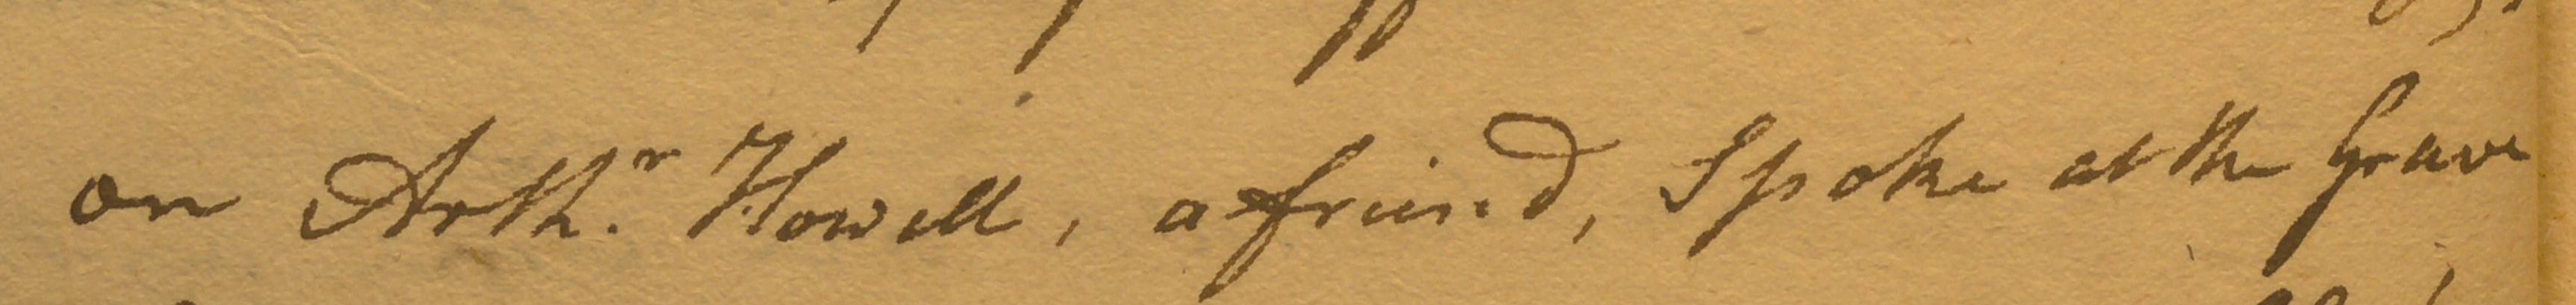on Arth^r. Howell, a friend, Spoke at the Grave
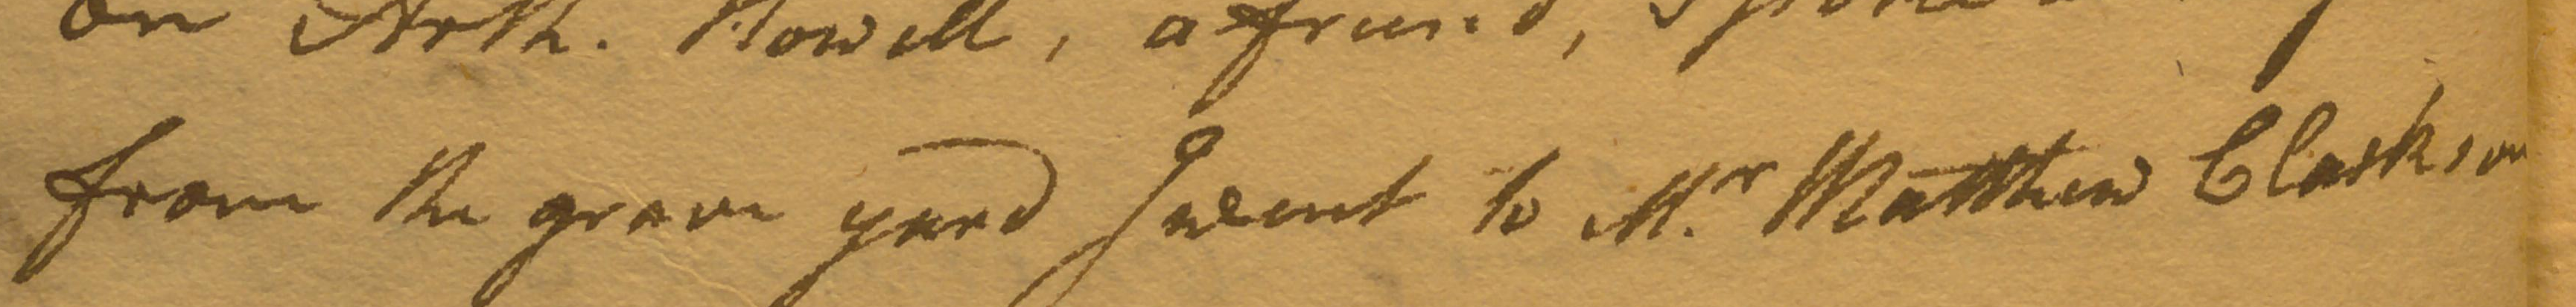from the grave yard went to M^r. Matthew Clarkson
